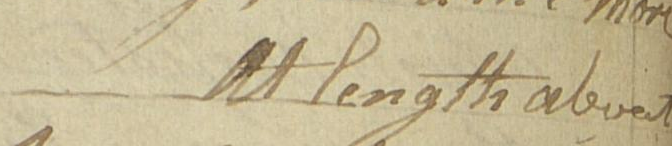At length above it
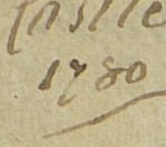1780
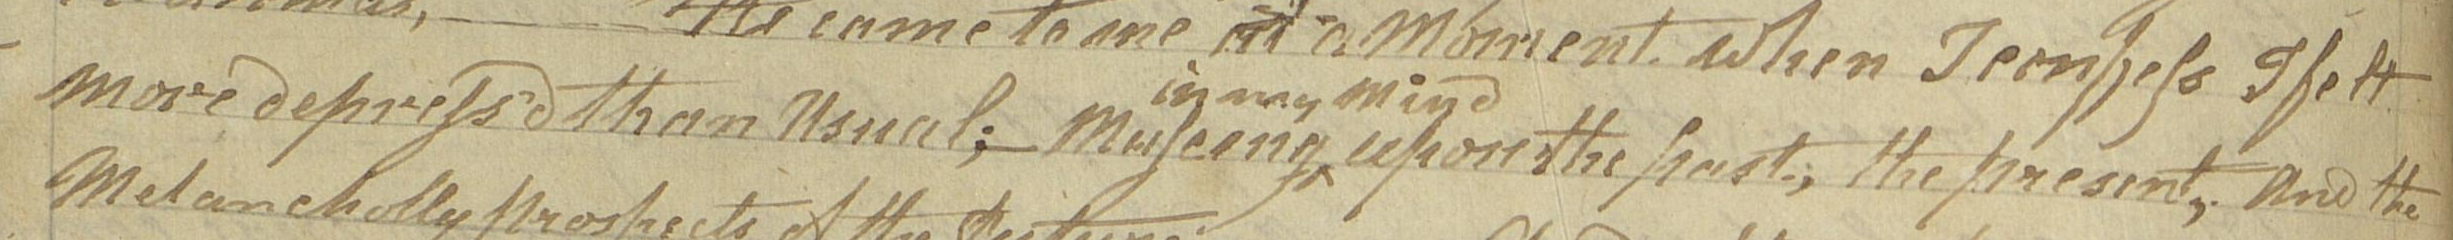more depressd than Usual; Museing ^ upon the past; the present, and the
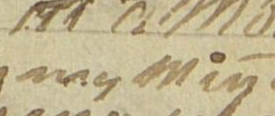in my Mind
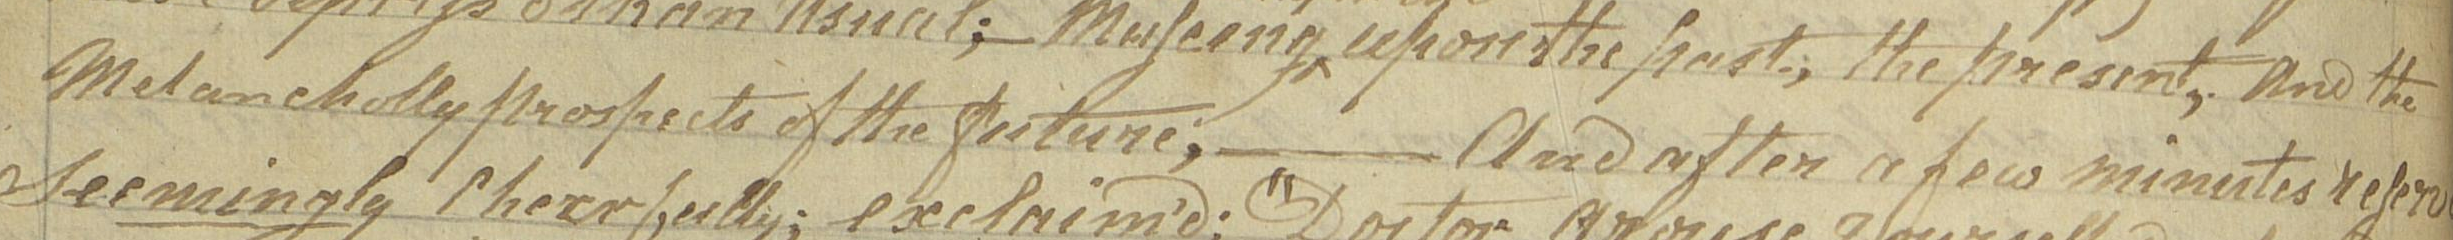Melancholly prospects of the future; And after a few minutes reserve
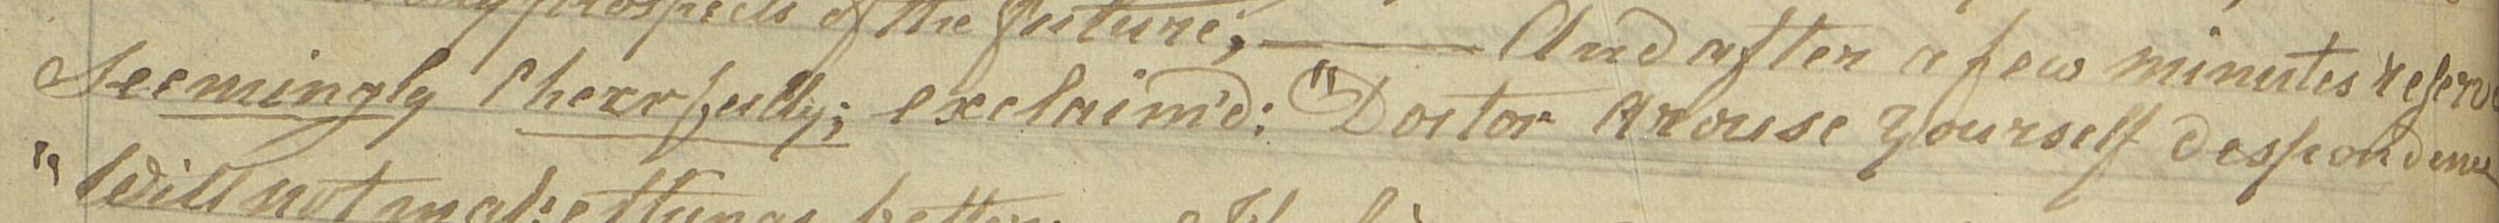Seemingly Chearfully; exclaim'd: "Doctor arouse yourself despondence
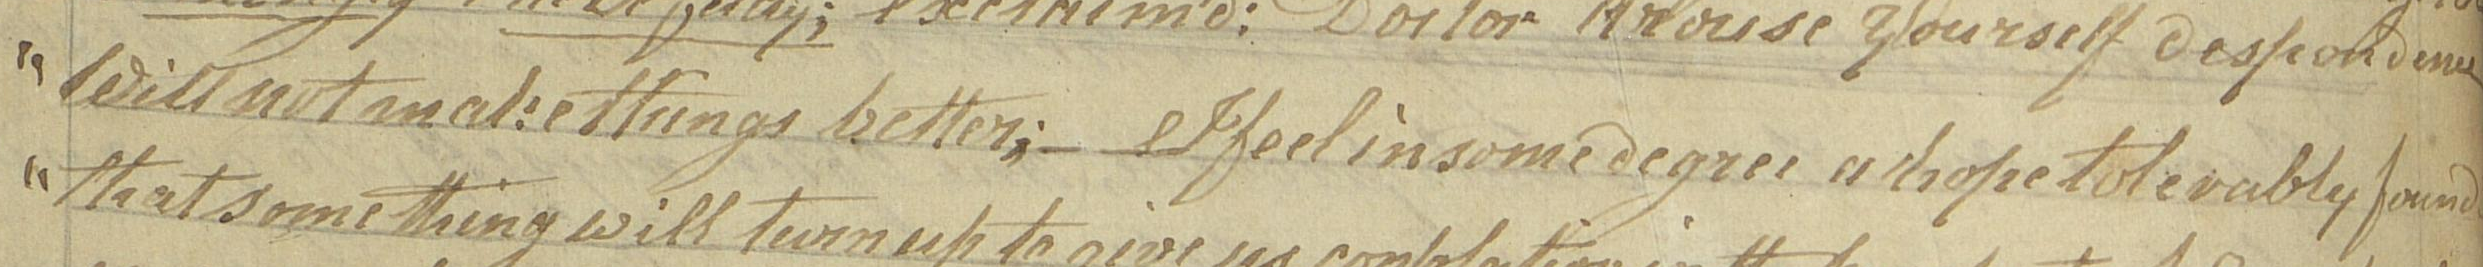"will not make things better; I feel in some degree a hope tolerably found
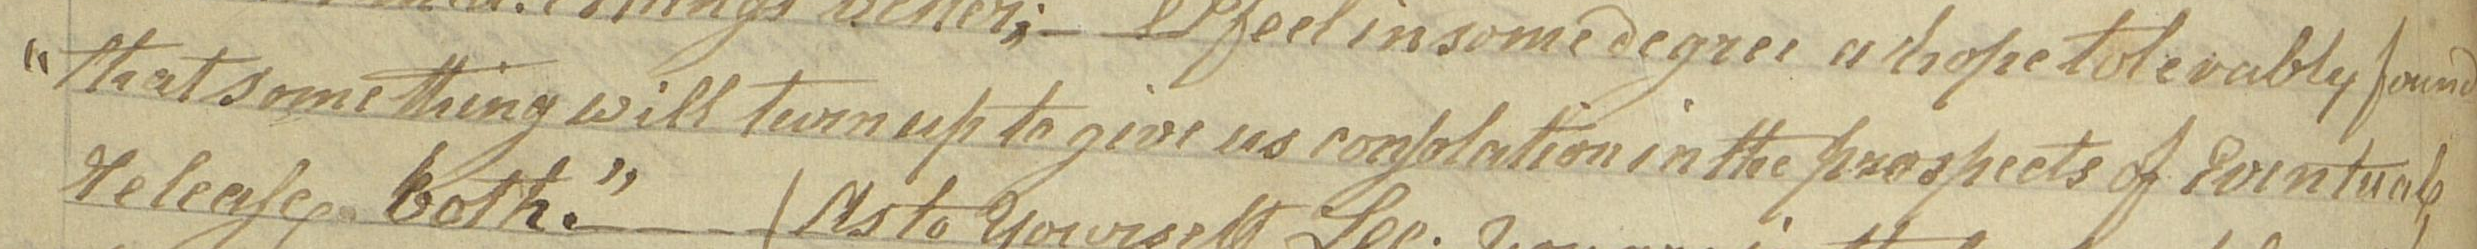"that something will turn up to give us consolation in the prospects of Eventual
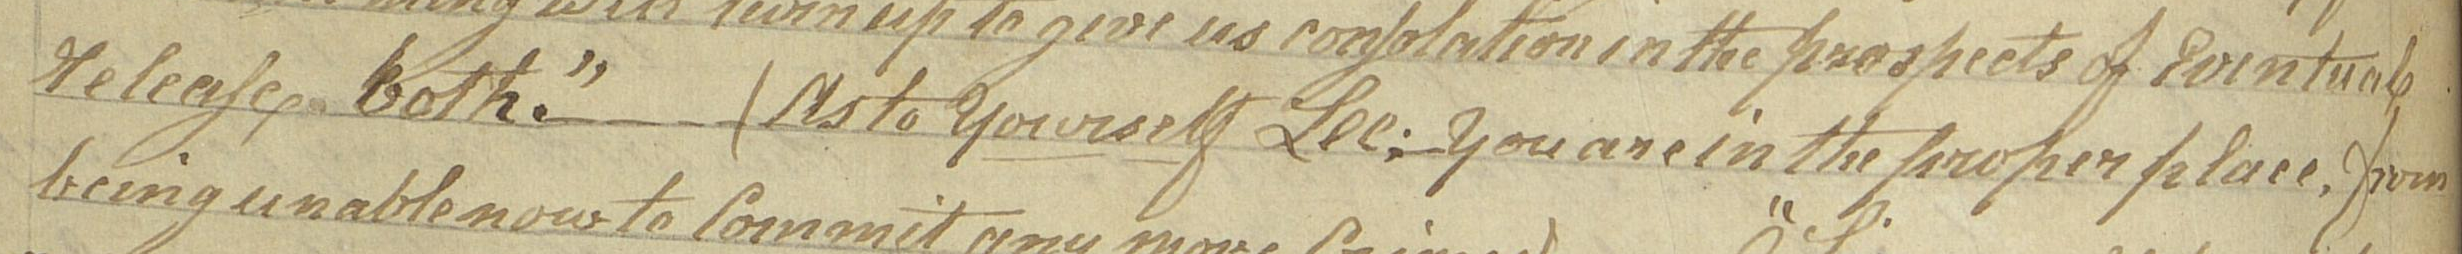release both." (As to Yourself Lee: you are in the proper place; from
